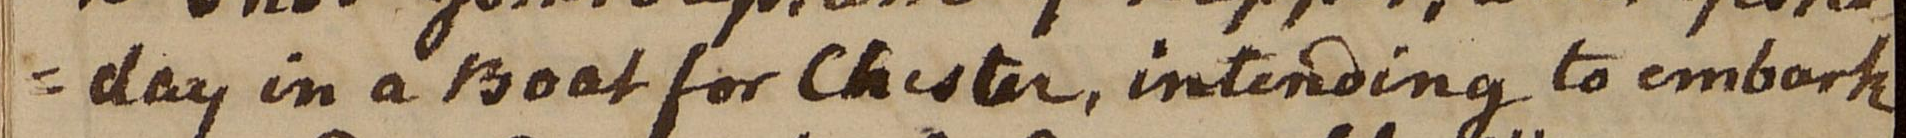-day in a Boat for Chester, intending to embark
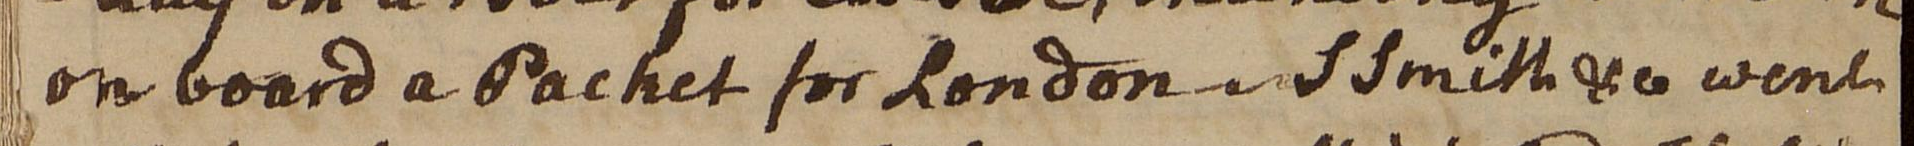on board a Packet for London - S Smith &c went
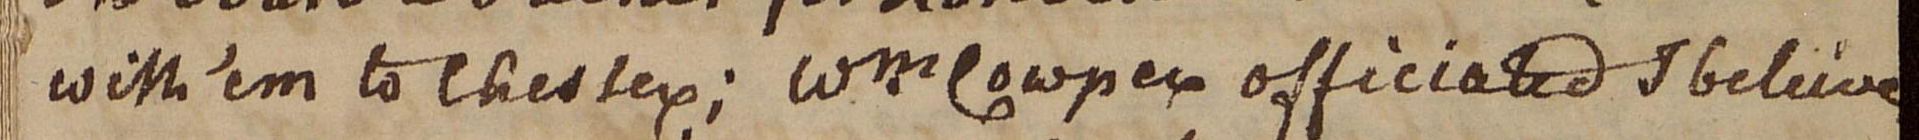with 'em to Chester; W^m Cowper officiated I beleive
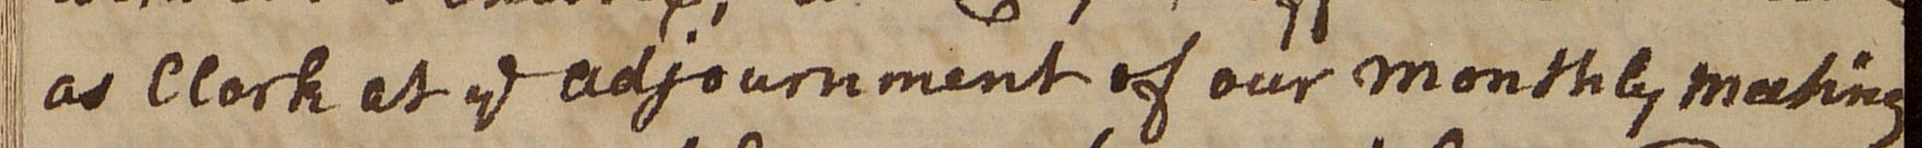as Clark at y^e adjournment of our monthly meeting
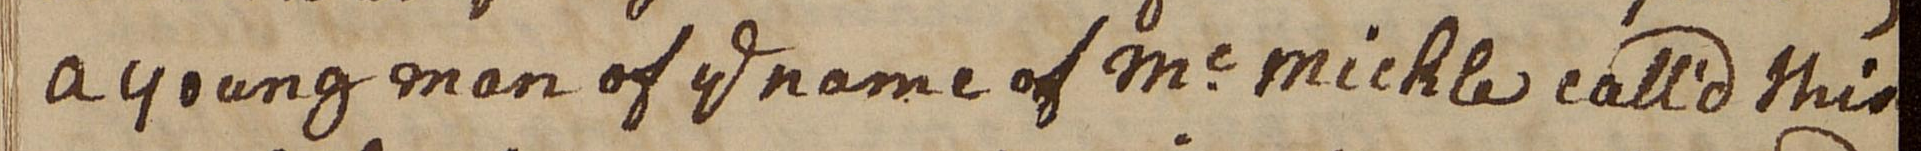a young man of y^e name of M^l. Mickle call'd this
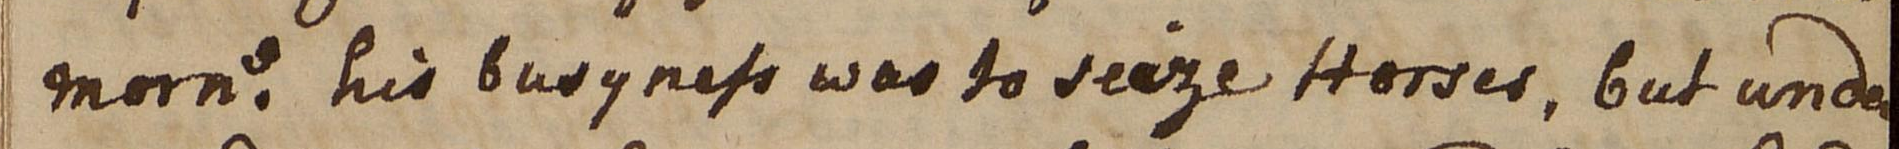morn^g., his busyness was to seize Horses, but und[er]
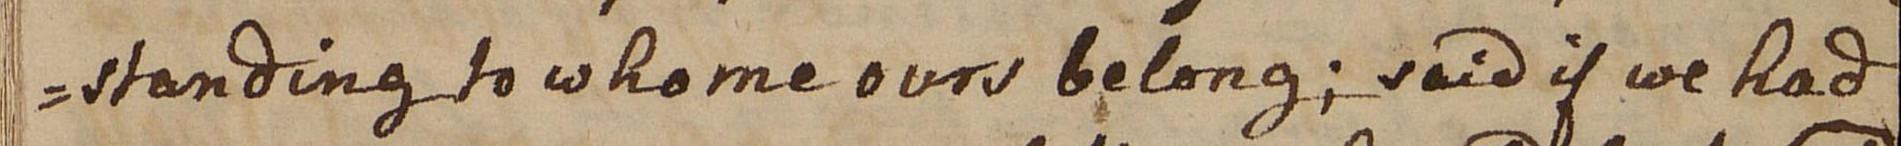-standing to whome ours belong; said if we had
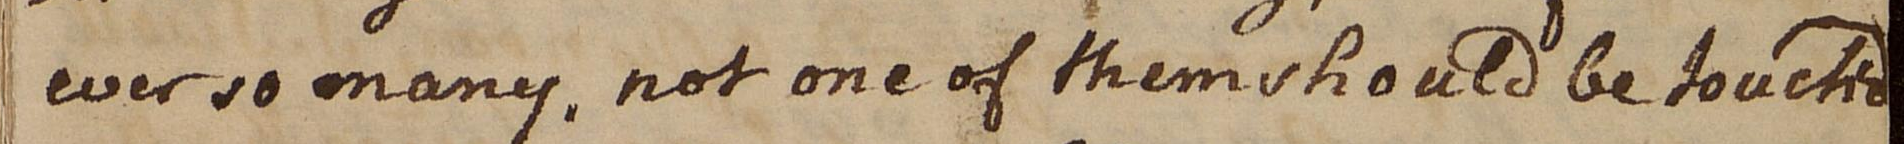ever so many, not one of them should be touch'd
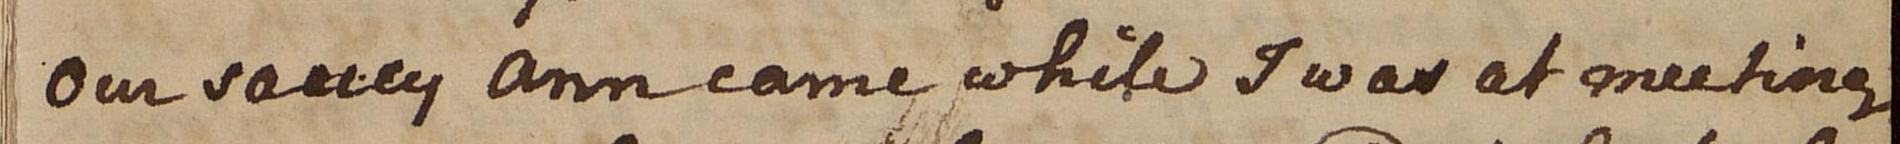our saucy Ann came while I was at meeting
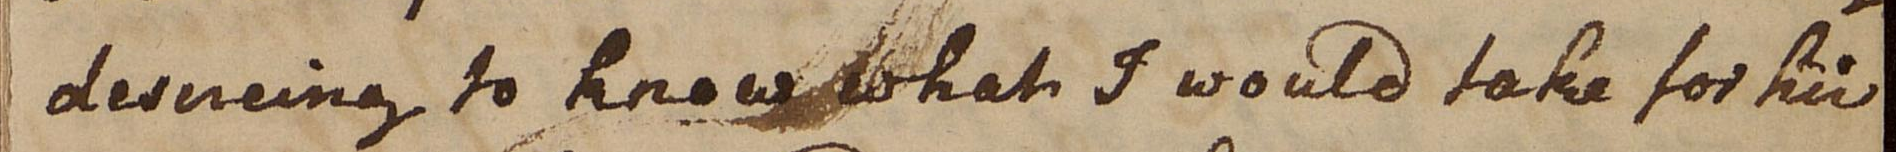deserving to know what I would take for him
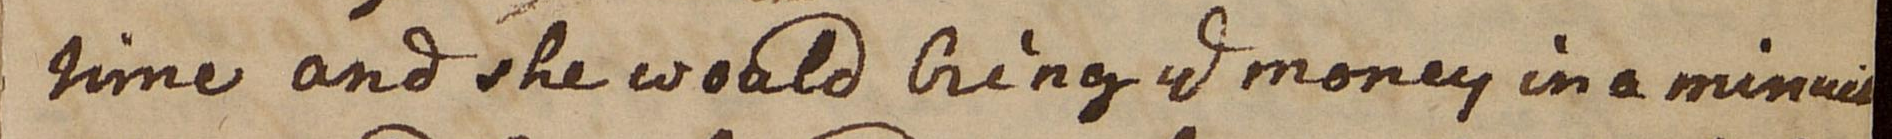time and she would bring y^e money in a minuit
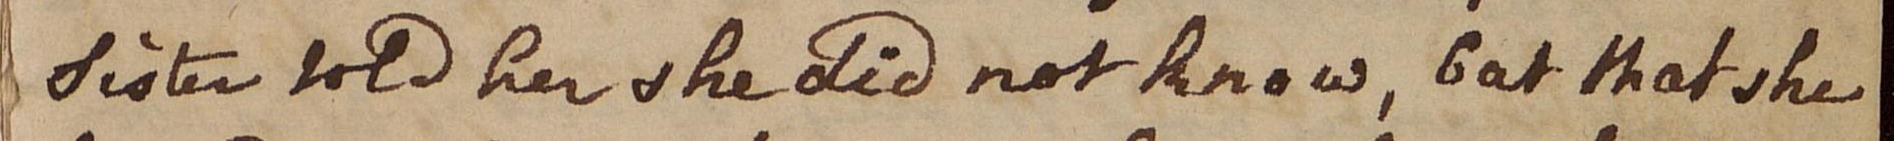Sister told her she did not know, but that she
